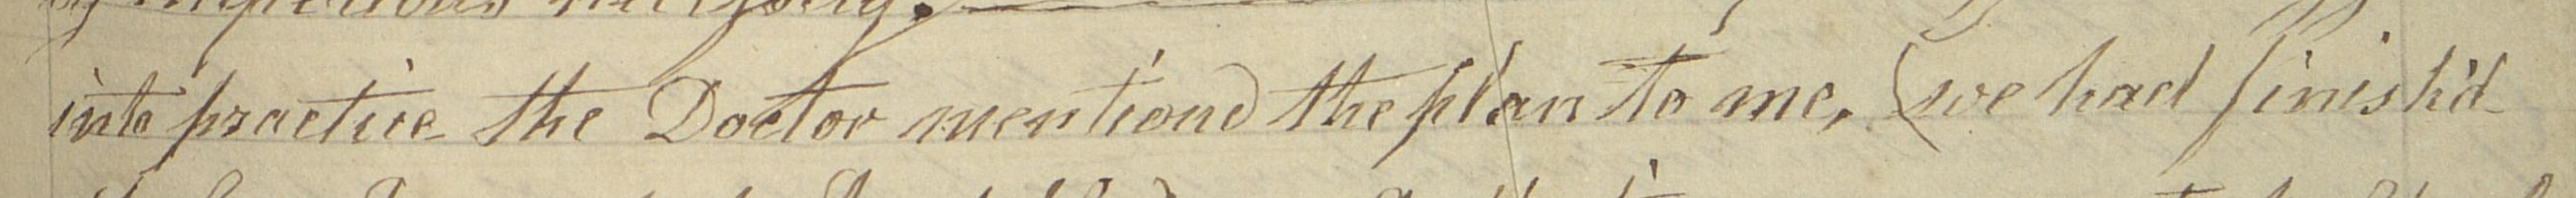into practice the Doctor mentiond the plan to me, (we had finish'd
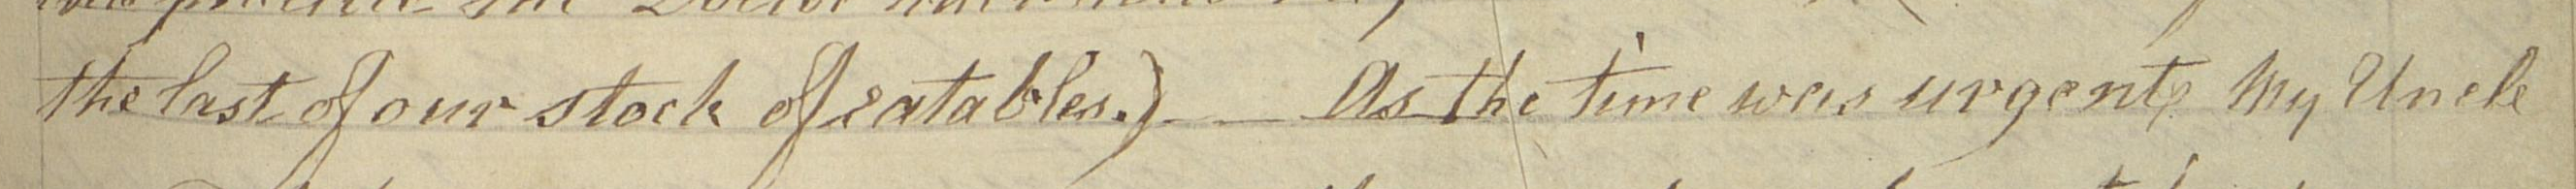the last of our stock of Eatables.) As the time was urgent my Uncle
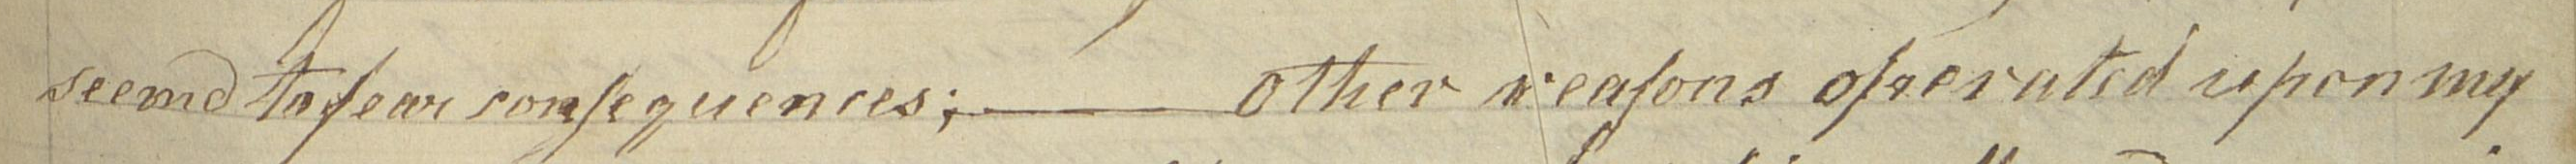seemd to fear consequences; Other reasons operated upon my
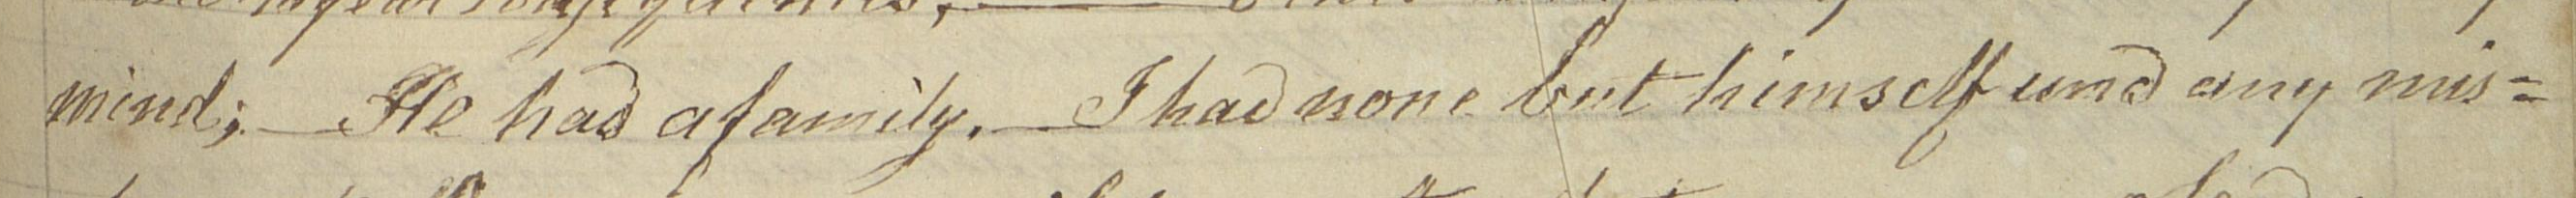mind; He had a family. I had none but himself and any mis-
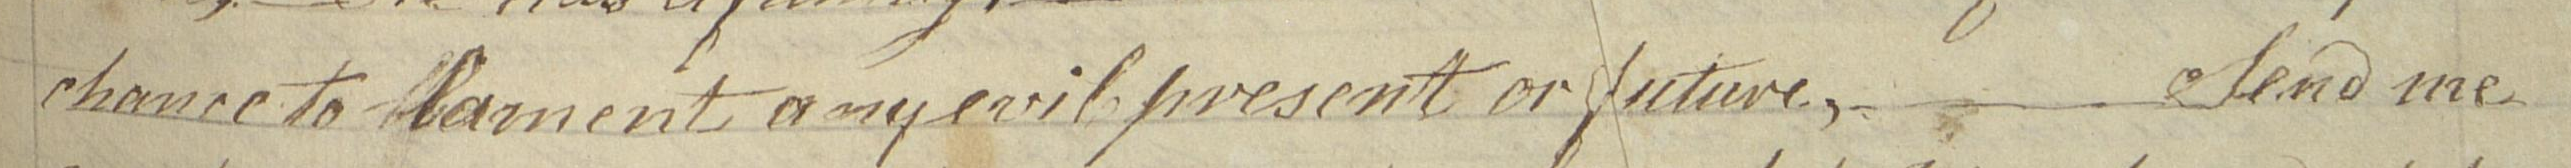chance to lament any evil present or future, Send me
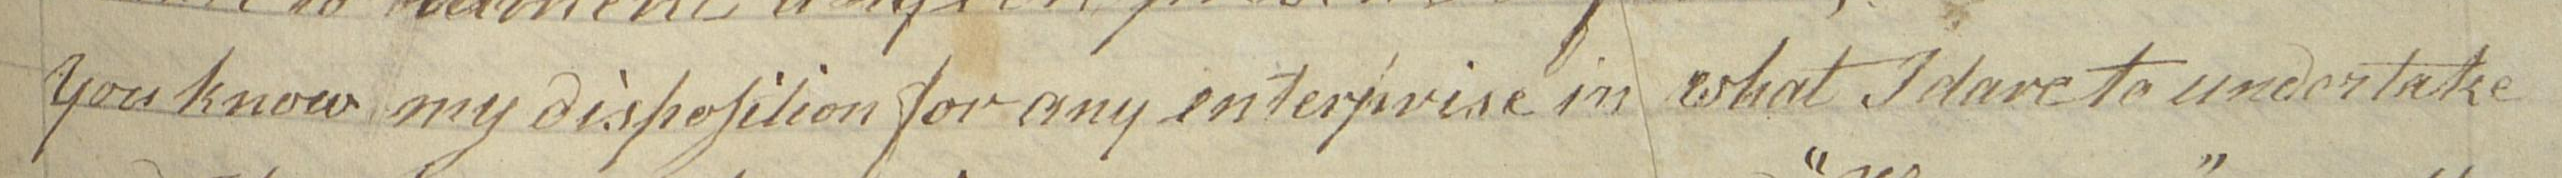you know my disposition for any enterprise in what I dare to undertake
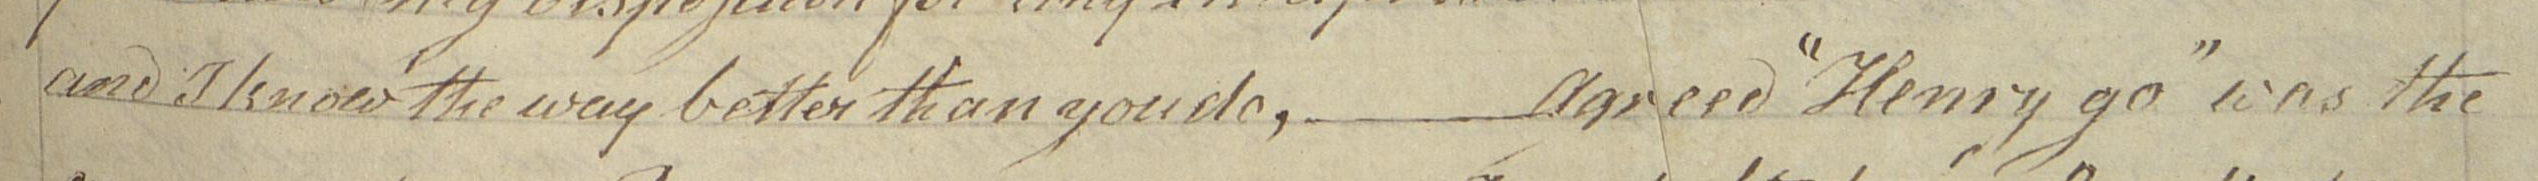and I know the way better than you do, Agreed "Henry go" was the
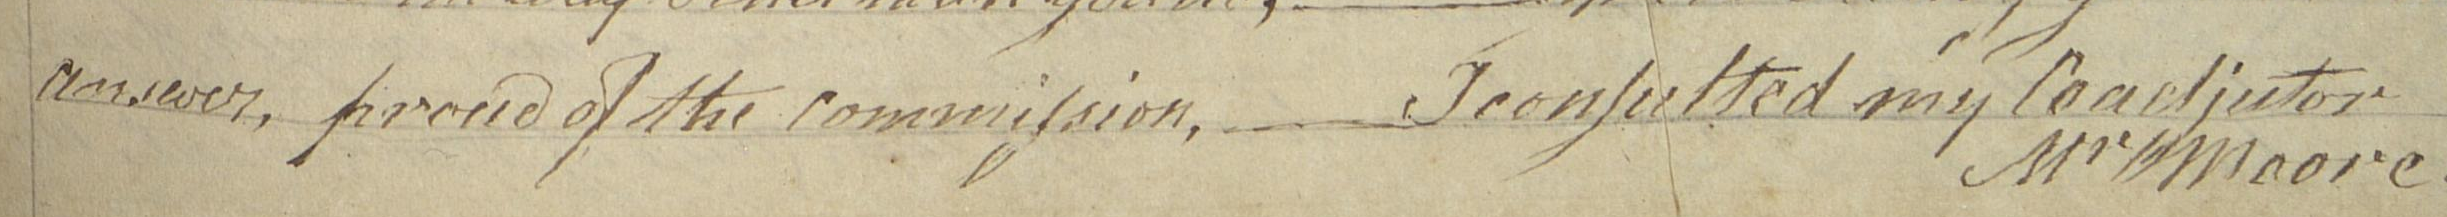answer, proved of the commission, I consented my Coadjutor
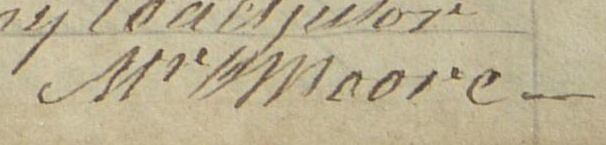M^r Moore
